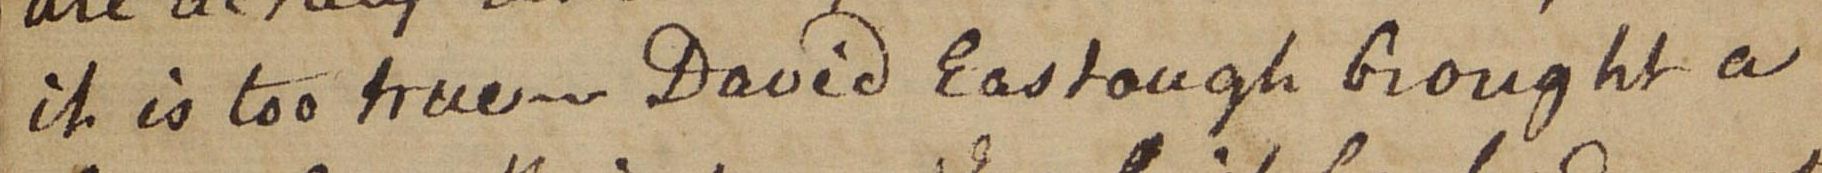it is too true- David Eastough brought a
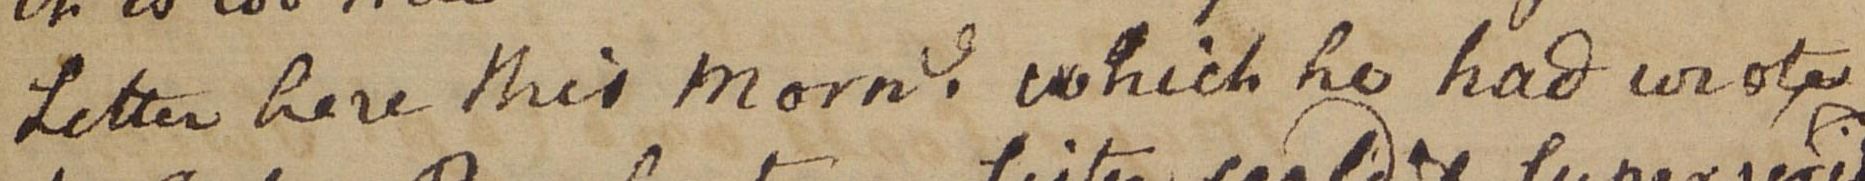Letter here this morn^g. which he had wrote
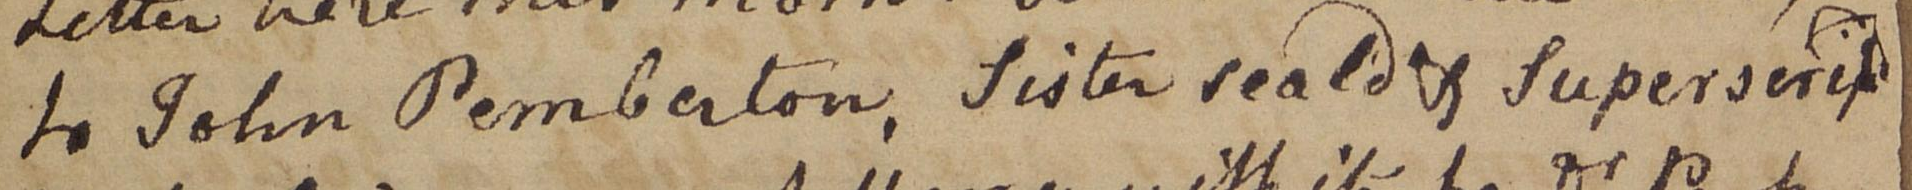to John Pemberton, Sister seal'd & Superscript
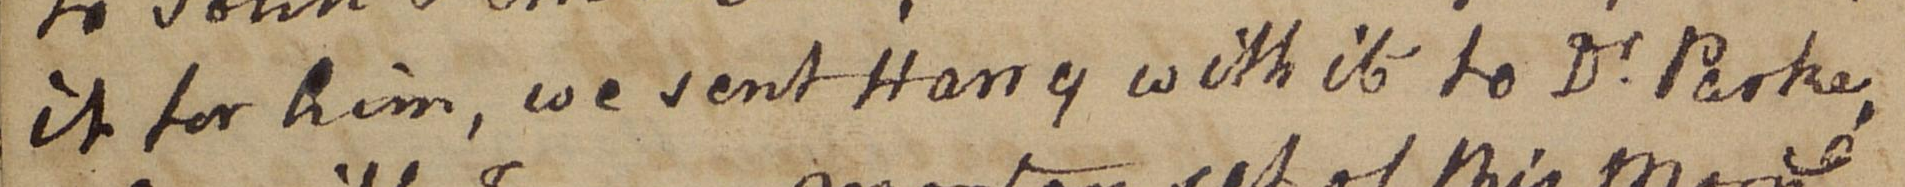it for him, we sent Harry with it to D^r. Parke,
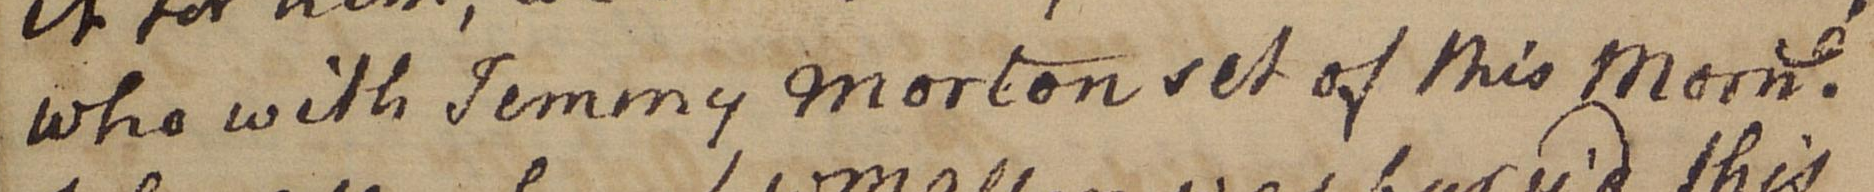who with Jemmy Morton set of this Morn^g.
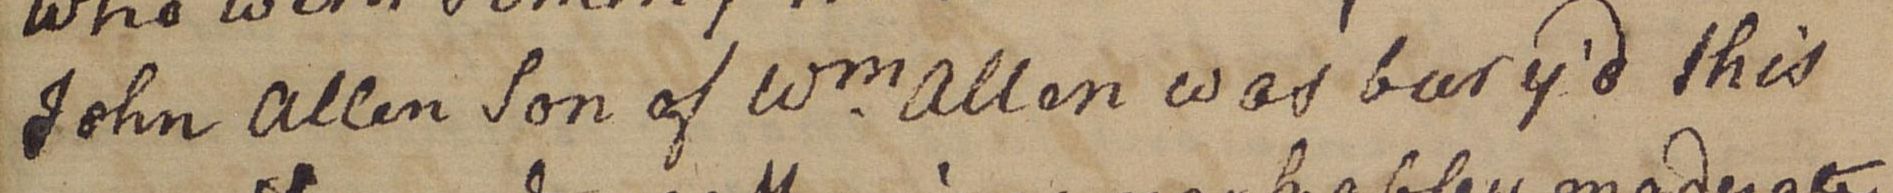John Allen Son of W^m. Allen was bury'd this
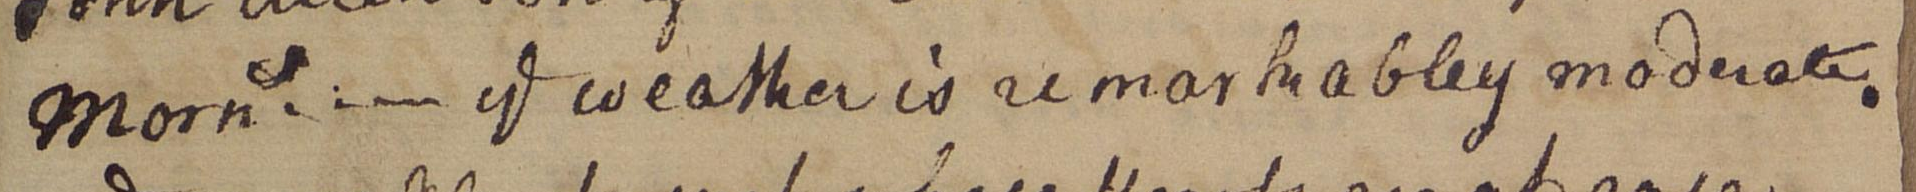Morn^g.- y^e weather is remarkably moderate.
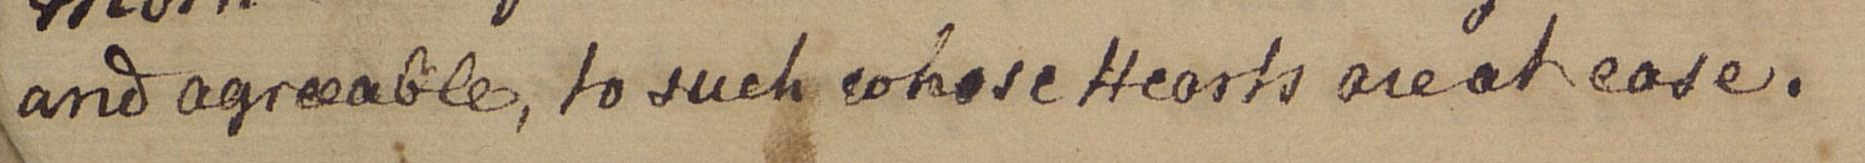and agreeable, to such whose Hearts are at ease.
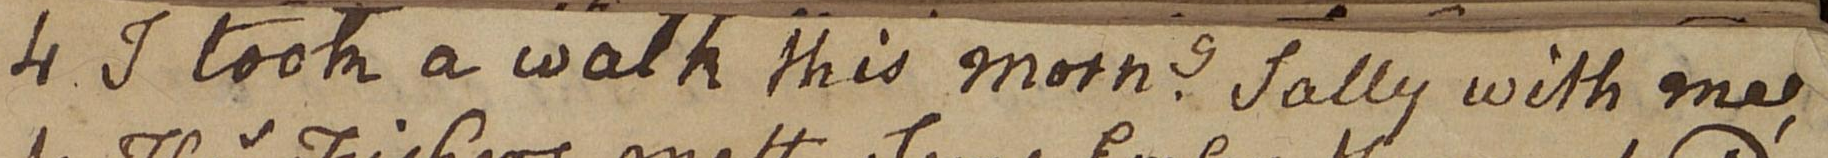4 I took a walk this morn^g. Sally with me,
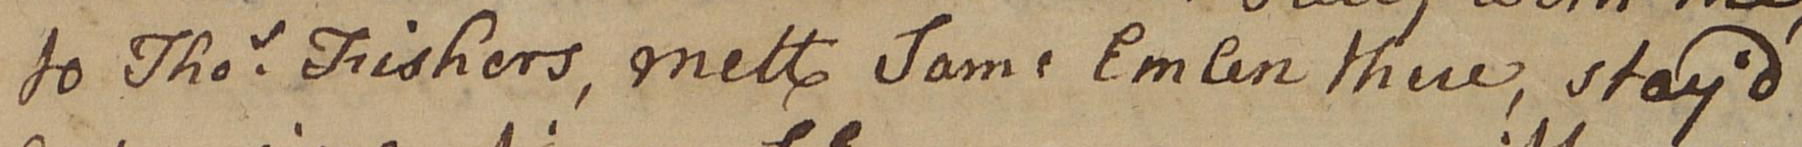to Tho.^s Fishers, mett Saml Emlen there, stay'd
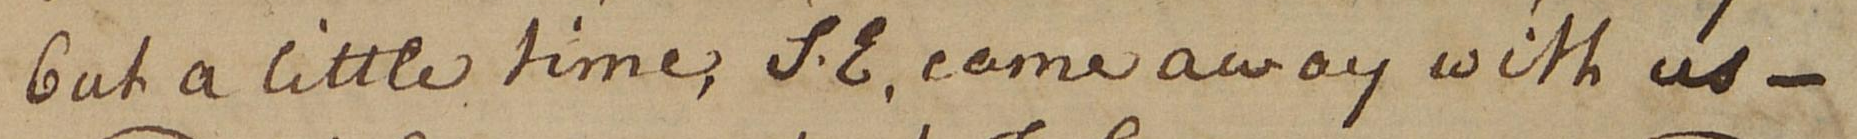but a little time, S.E. came away with us-
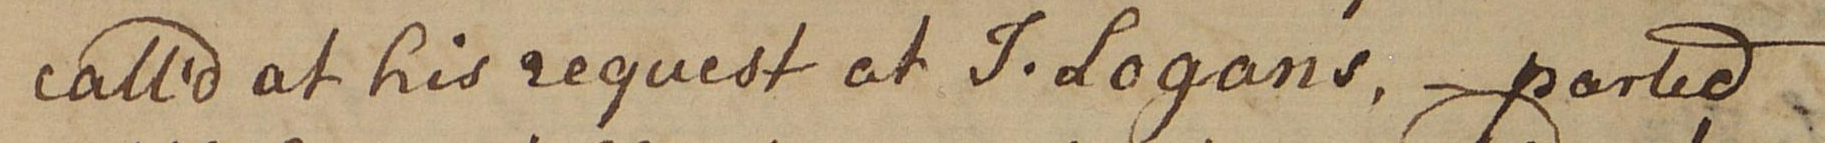call'd at his request at T. Logans,- parted
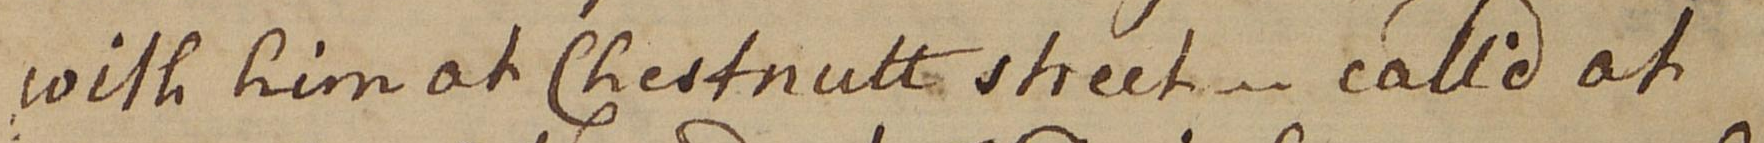with him at Chestnutt street- call'd at
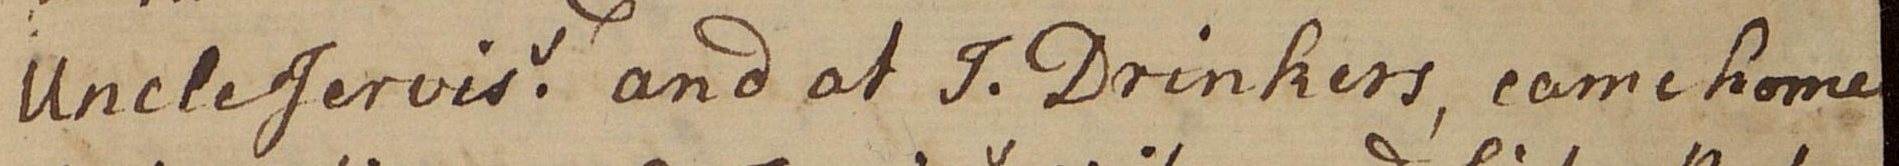Uncle Jervis^s. and at T. Drinkers, came home
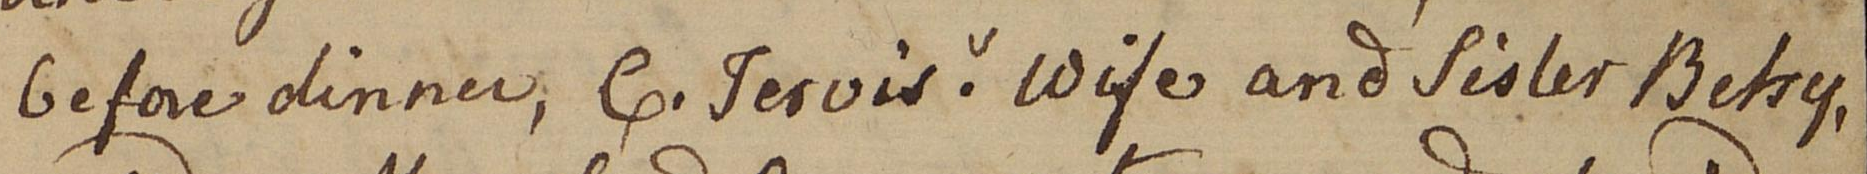before dinner, C. Jervis^s. Wife and Sister Betsy,
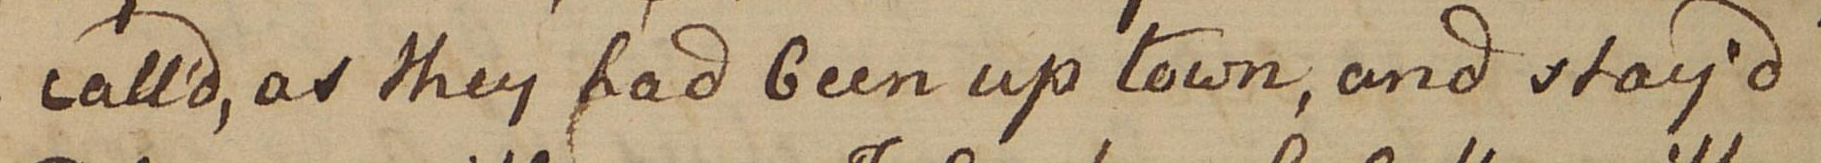call'd, as they had been up town, and stay'd
